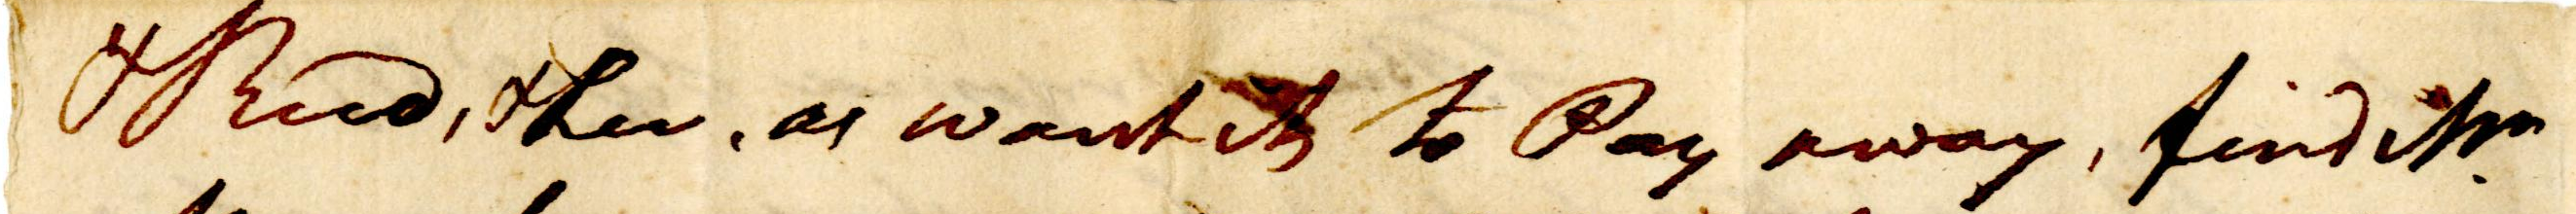& Reed, & Lee, as want it to pay away, find its
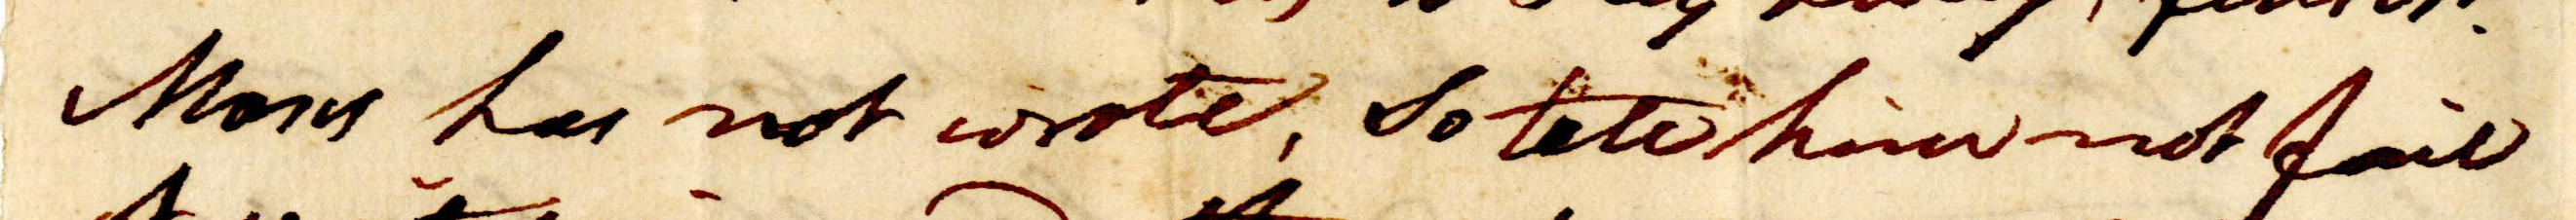Moses has not wrote, So tell him not fail
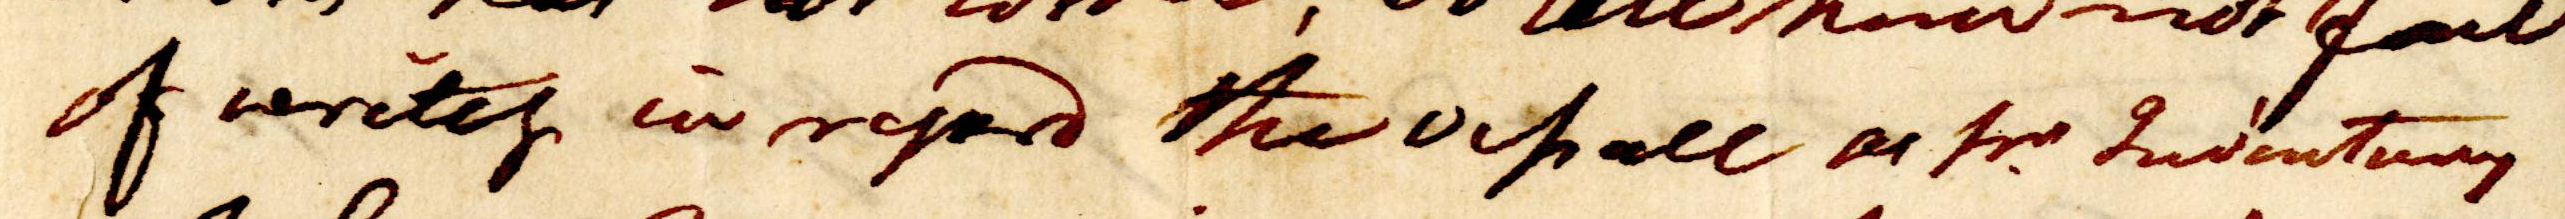of writeg in regard the vessall as p^r. Inventory
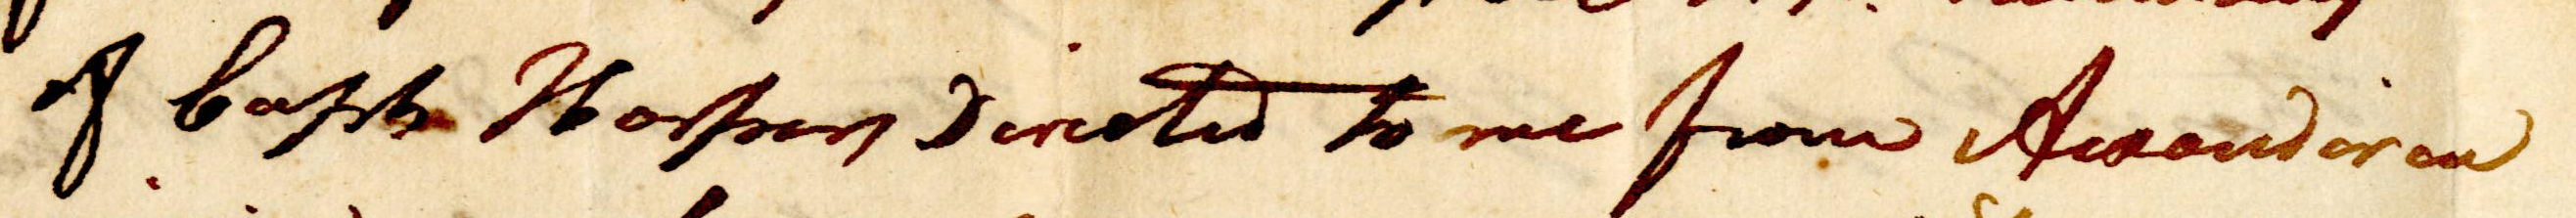of Capt Harper Directed to me from Alexandria
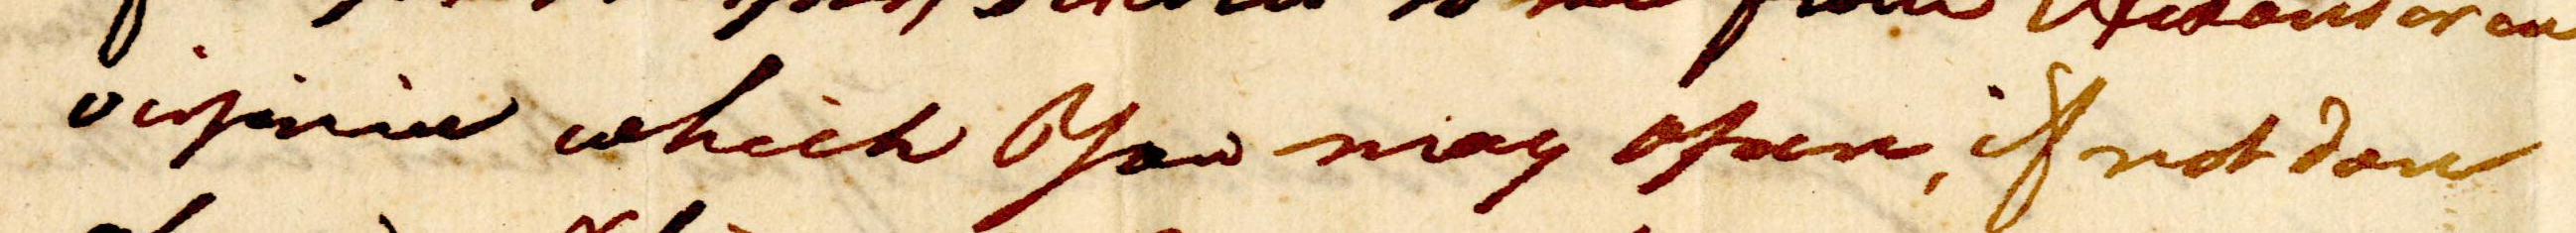Virginia which you may open, if not done
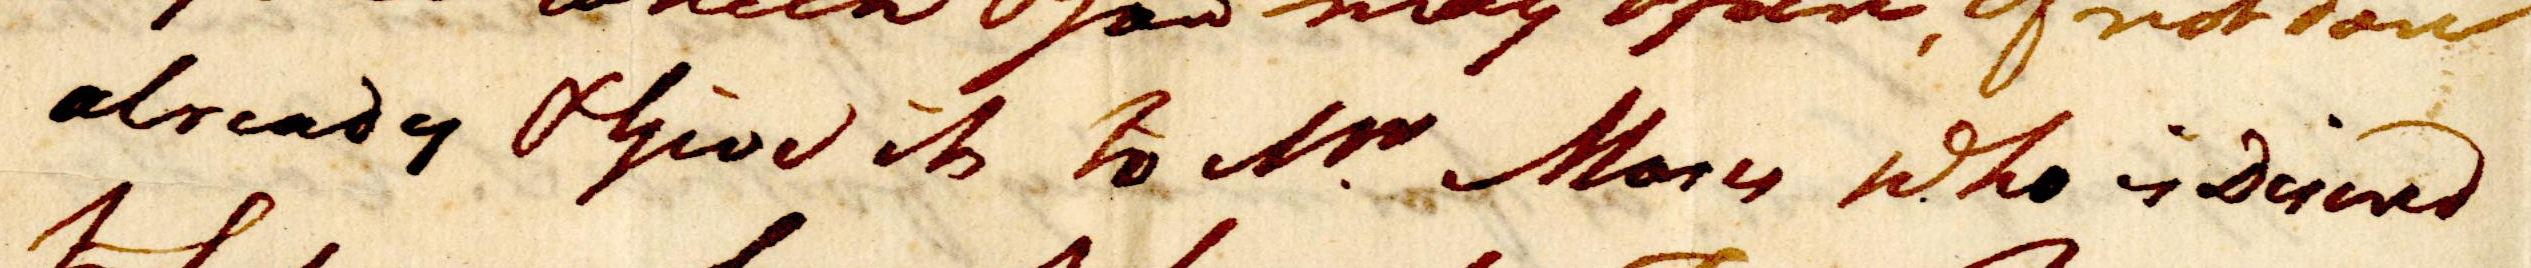already & Give it to M^r. Moses who is Desired
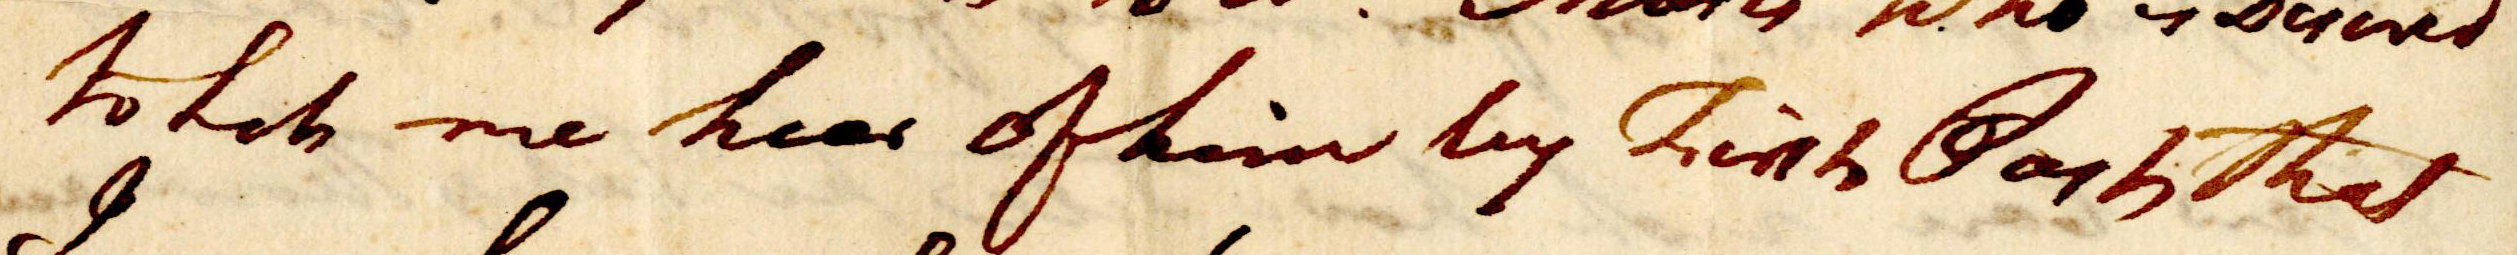to Let me hear of him by First Post that
